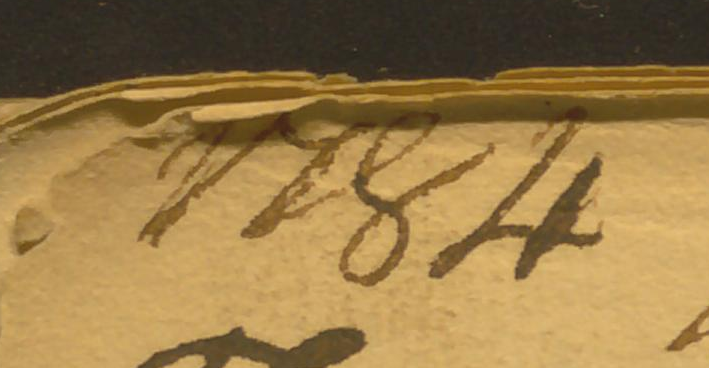1784
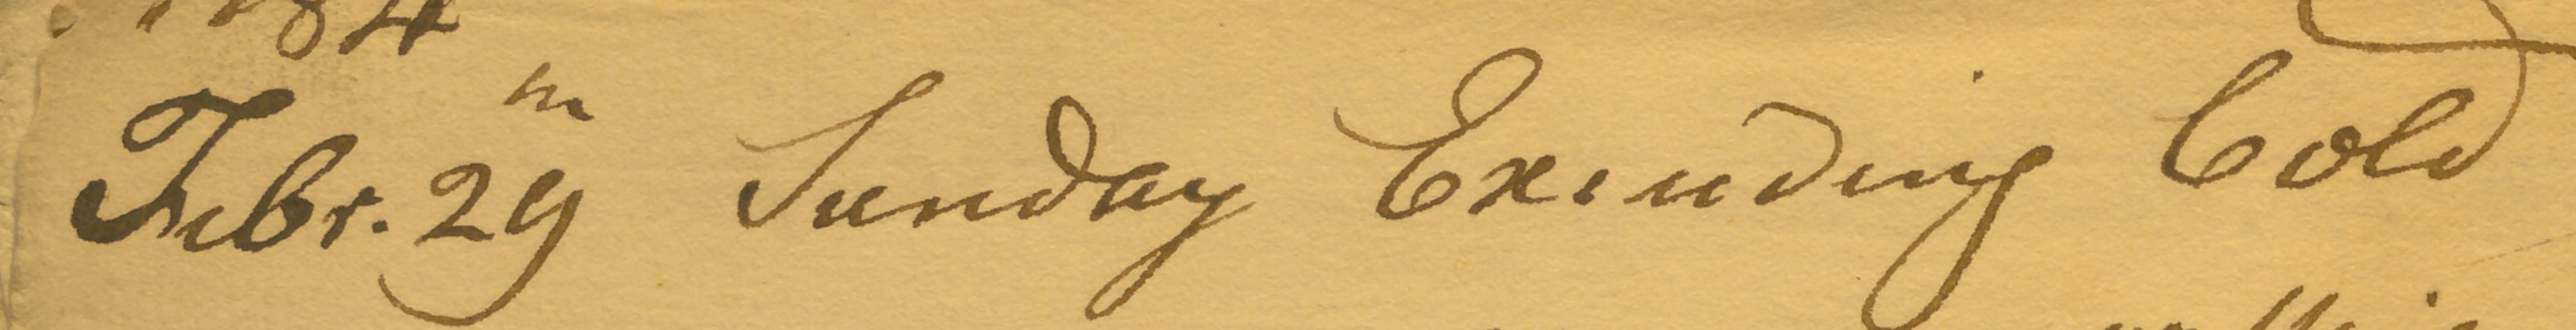Febr. 29^th Sunday Exceding Cold
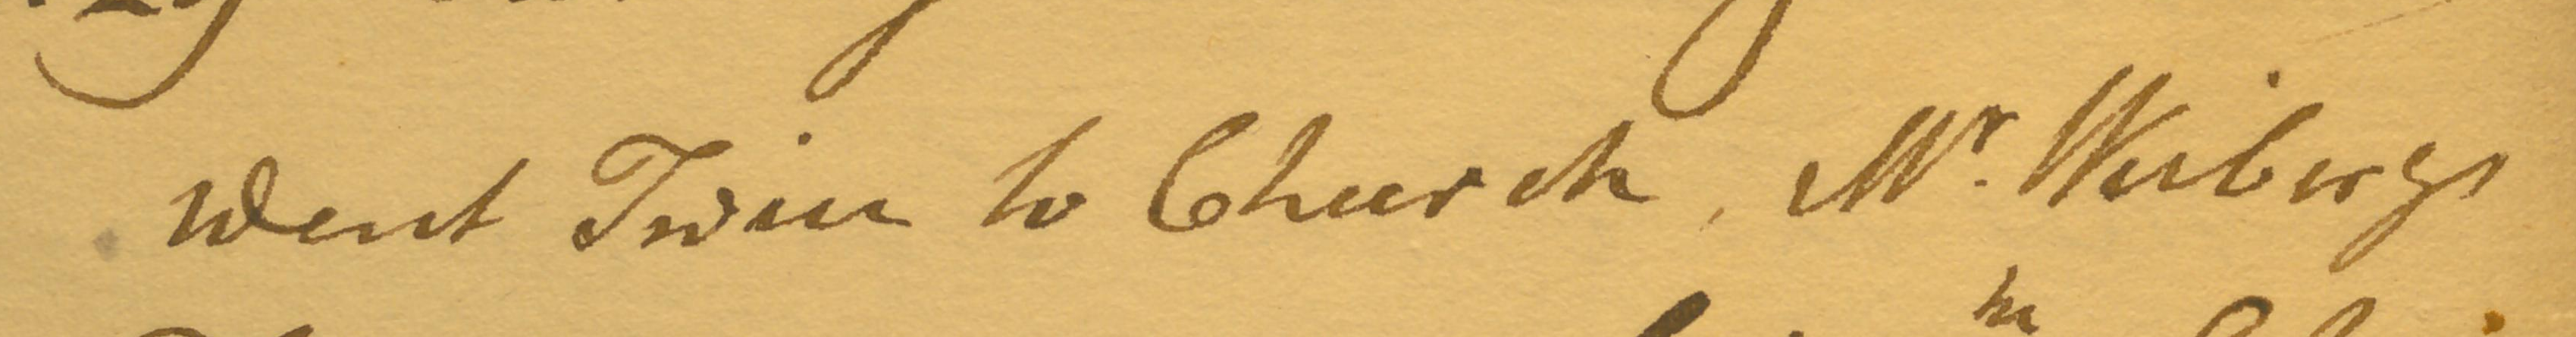Went Twice to Church, M^r. Weibergs
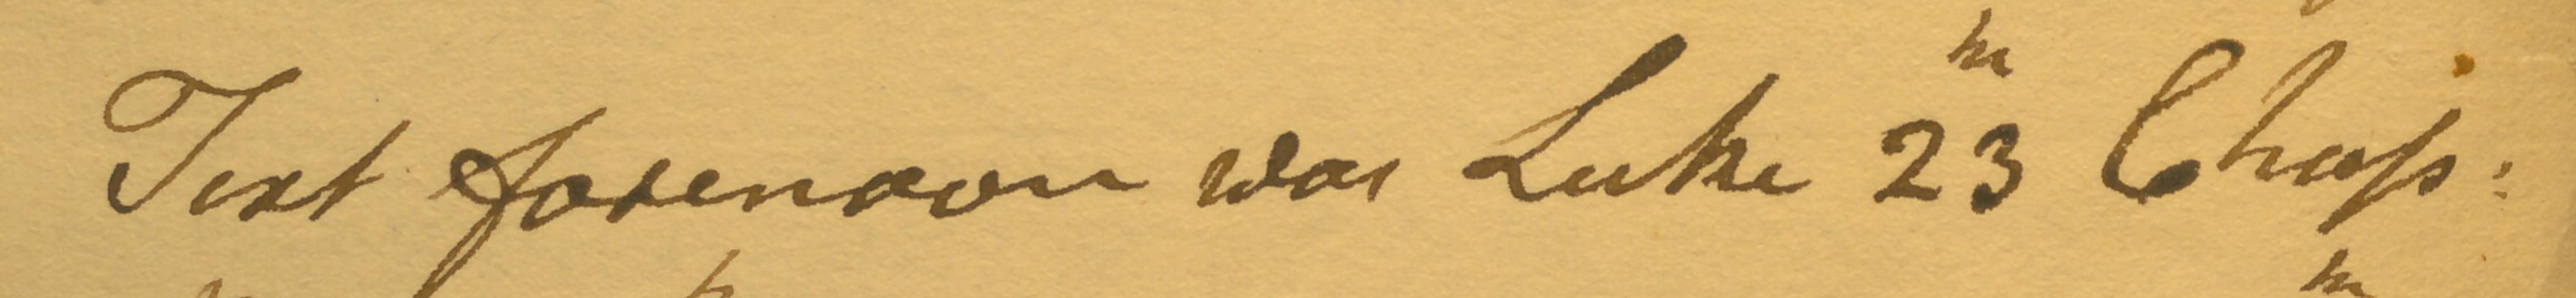Text forenoon was Luke 23^th Chap
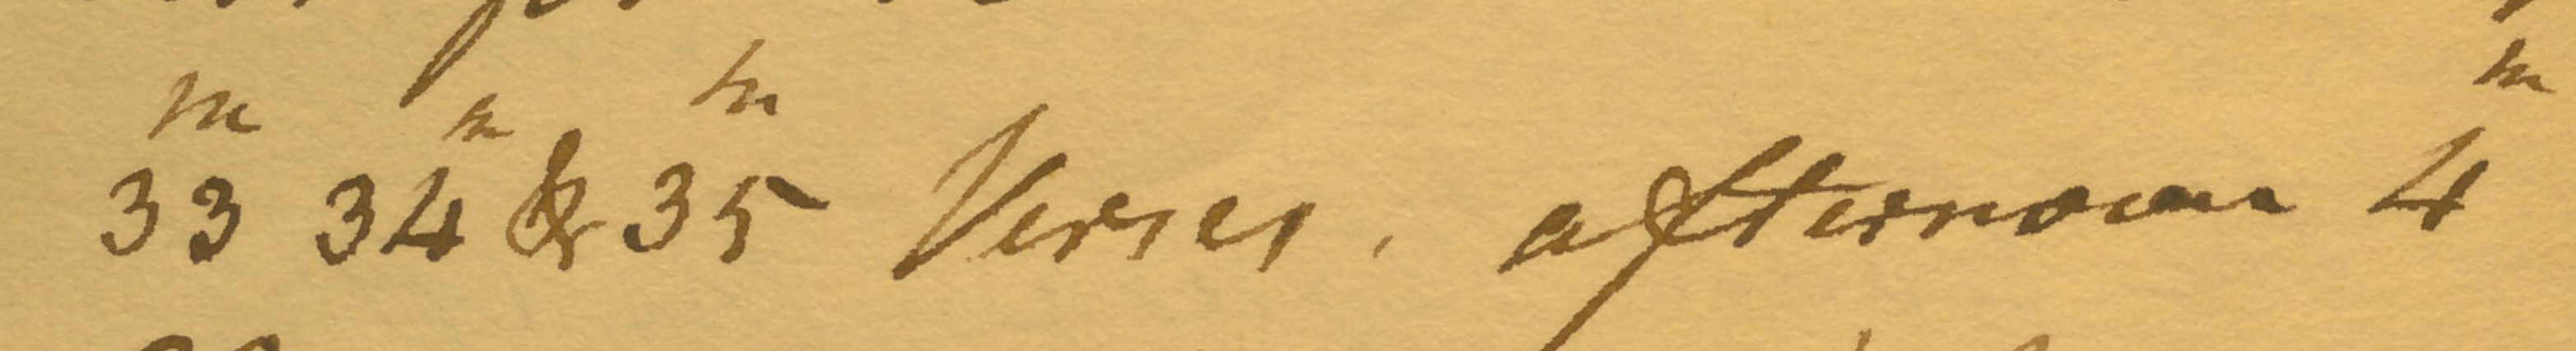33^th 34^th & 35^th Verses, afternoon 4^th
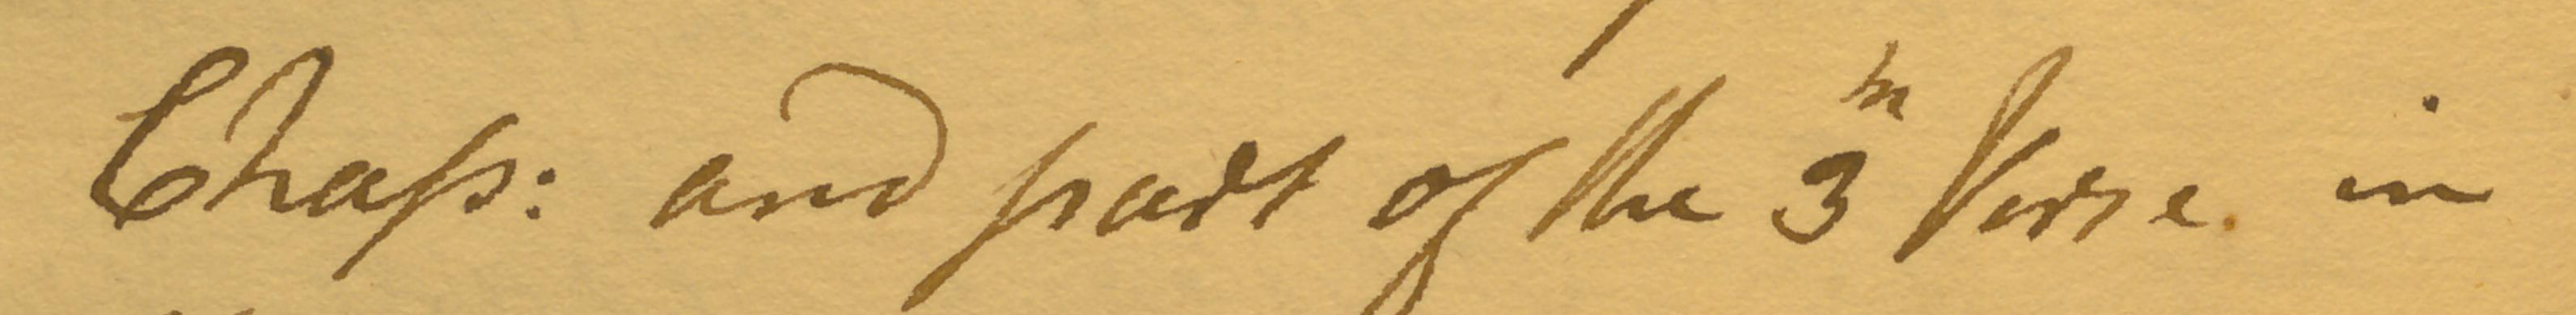Chap: and part of the 3 Verse in
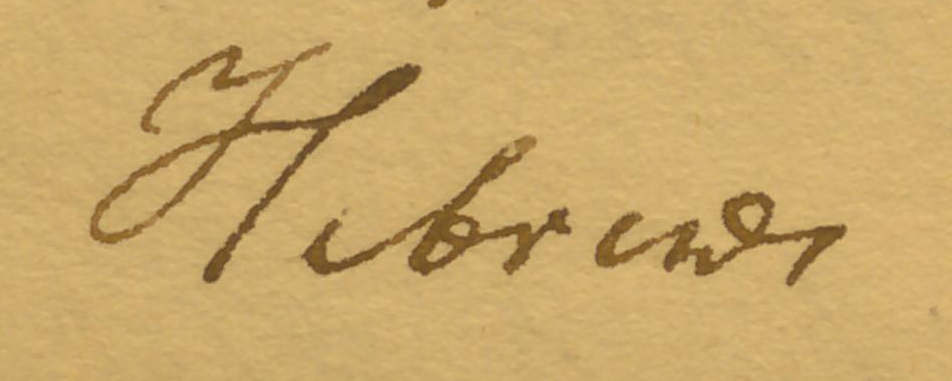Hebrews
